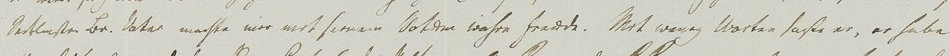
Secklmstr Br. Vater machte mir mit seinem Votum wahre Freude. Mit wenig Worten sagte er, er habe
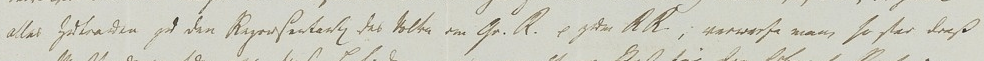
alles Zutrauen zu den Repräsentanten des Volkes im Gr. R. u zum RR; verwerfe man, so sei dieß
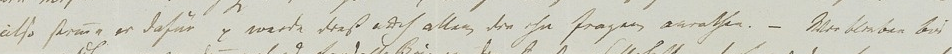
also stimme er dafür & werde dieß auch allen, die ihn fragen, anrathen. – Wir blieben bis
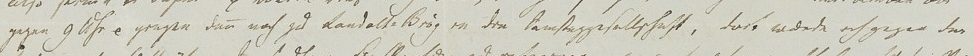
gegen 9 Uhr & gingen dann noch zu Landolt-Brög in die Samstaggesellschaft, dort wurde ich gegen das
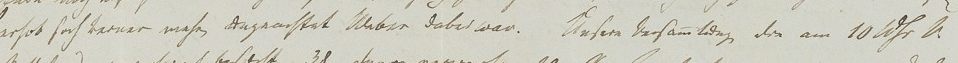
erhob sich keiner mehr, ungeachtet Weber dabei war. Unsere Versammlung die am 10 Uhr V.
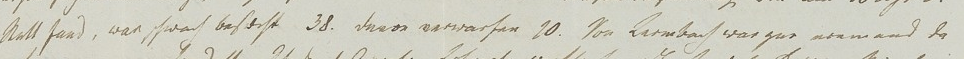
statt fand, war schwach besucht 38, davon verwarfen 10. Von Leimbach war gar niemand da
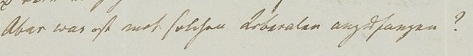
Aber was ist mit solchen Liberalen anzufangen?
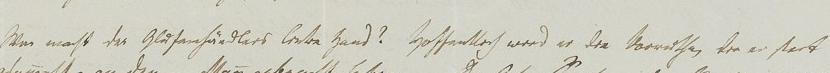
Was macht des Glusenhändlers linke Hand? Hoffentlich wird er die Vorräthe, die er seit
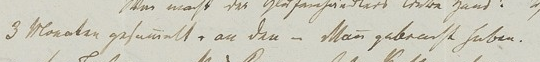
3 Monaten gesammelt, an den – Mann gebracht haben.
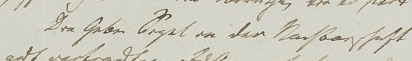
Die Gebr. Vogel in der Nachbarschaft
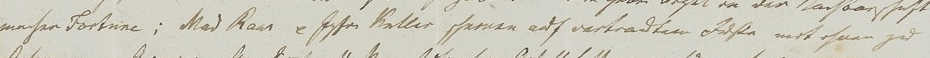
machen Fortune; Mad. Rans & Jgfr. Keller scheinen auf vertrautem Fuße mit ihnen zu
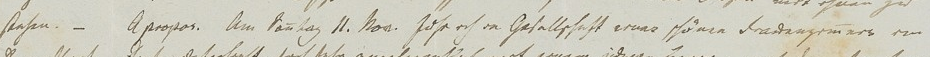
stehen. – A propos. Am Sonntag 11. Nov. fuhr ich in Gesellschaft eines schönen Frauenzimmers im
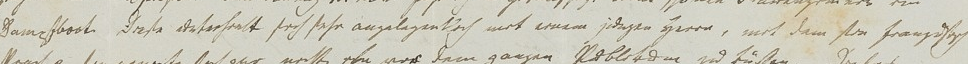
Dampfboot. Diese unterhielt sich sehr angelegentlich mit einem jungen Herrn, mit dem sie französisch
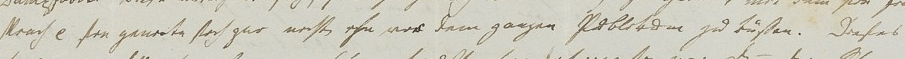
sprach & sie genirte sich gar nicht, ihn vor dem ganzen Publikum zu küssen. Dieses
